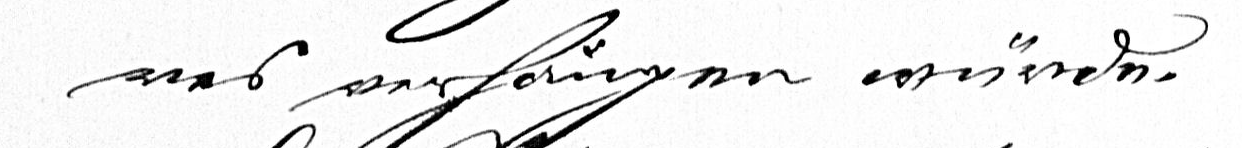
res verhängen würde.
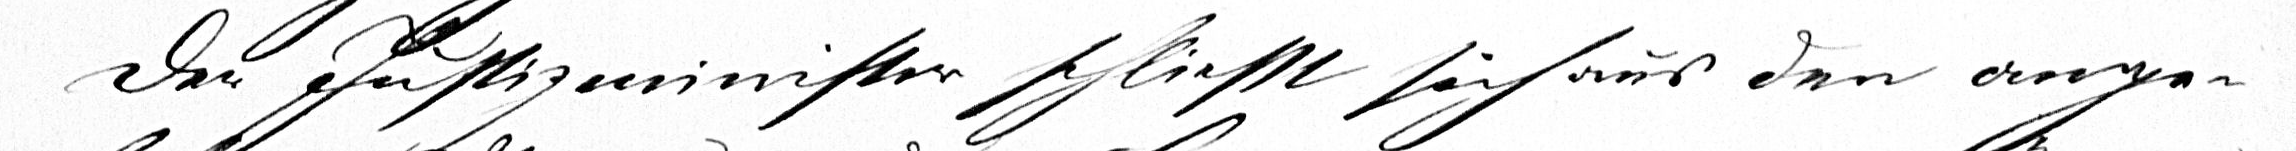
Der Justizminister schließt sich aus den ange¬
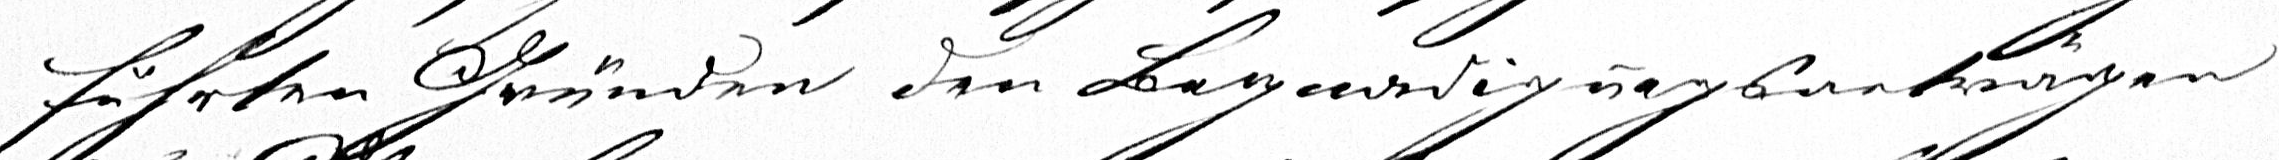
führten Gründen den Begnadigungsanträgen
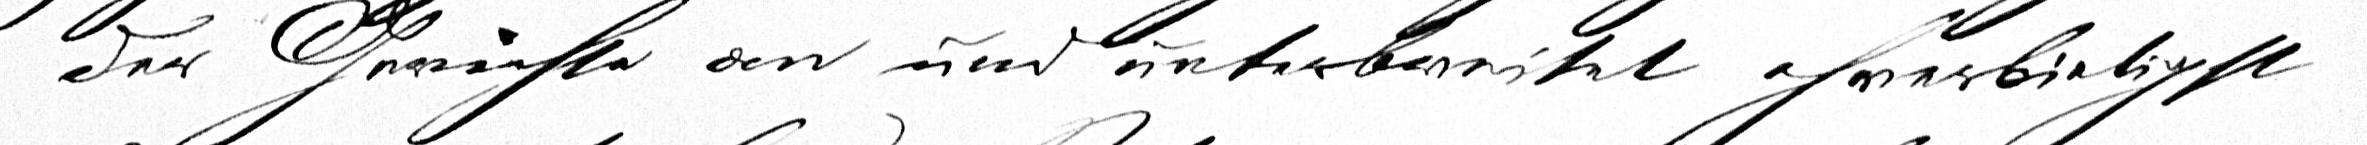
der Gerichte an und unterbreitet xxbieligst
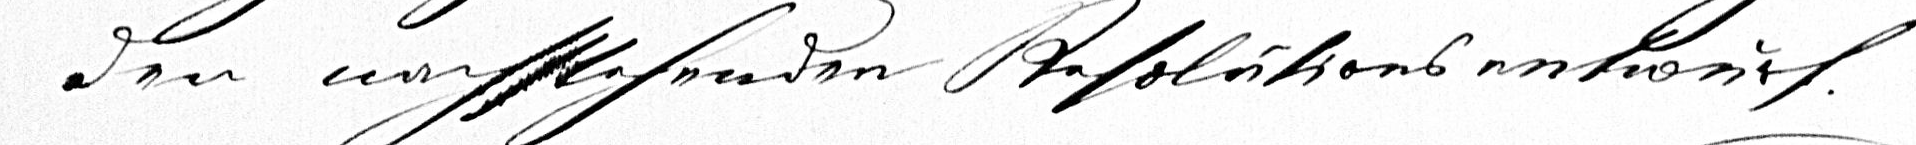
den nachstehenden Resolutionsentwurf.
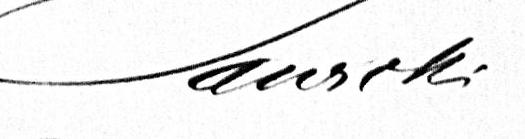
Sawicki
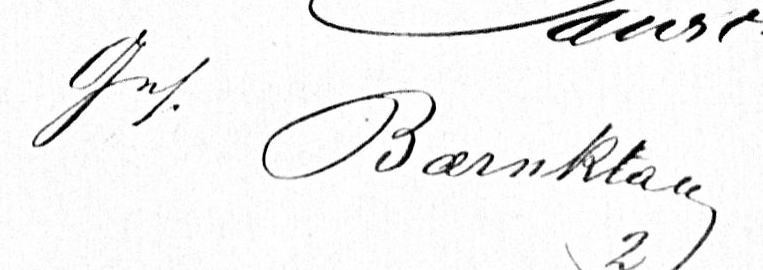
Ges. Barnklau
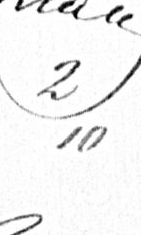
2/10
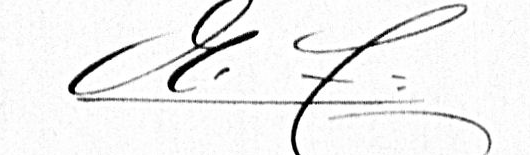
A. E.
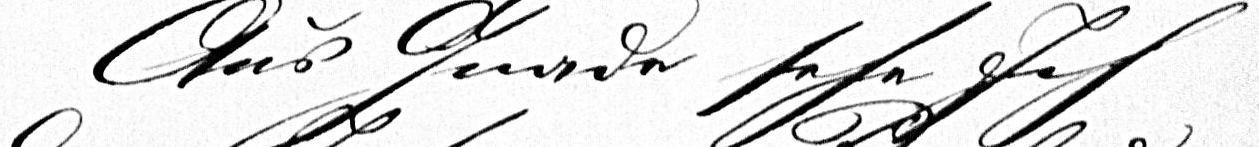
Aus Gnade sehe Ich
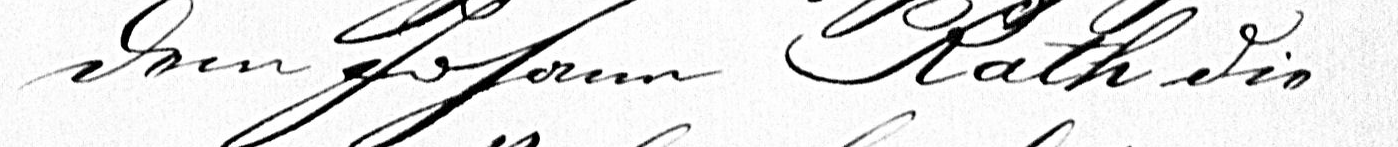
dem Johann Rath die
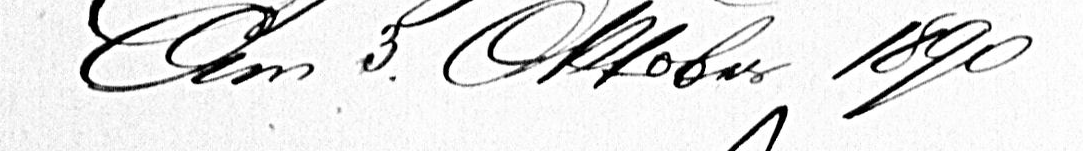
Am 3. Oktober 1890
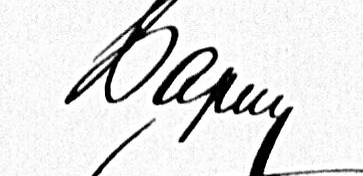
xx
